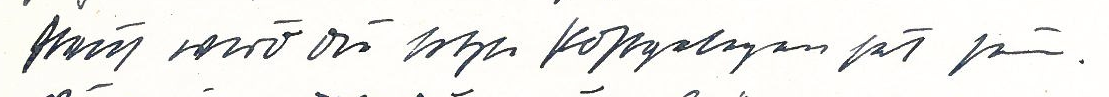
Gleich wird die letzte Postgelegenheit sein.
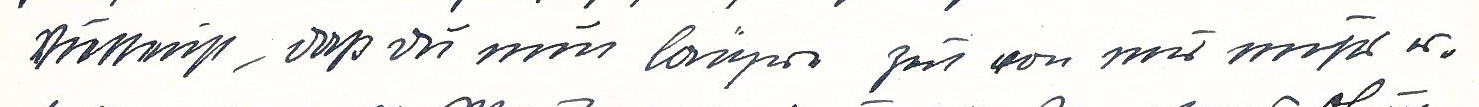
Vielleicht, daß Du nun längere Zeit von mir nichts er¬
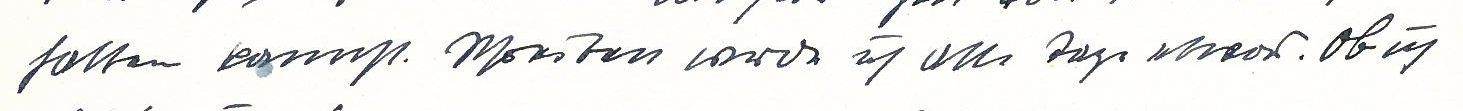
halten kannst. Schreiben werde ich alle Tage etwas. Ob ich
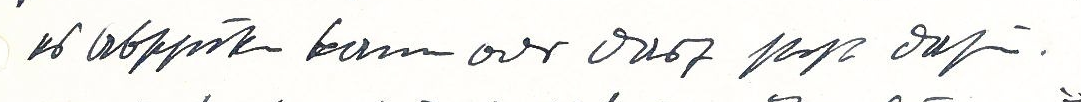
es abschicken kann oder darf steht dahin.
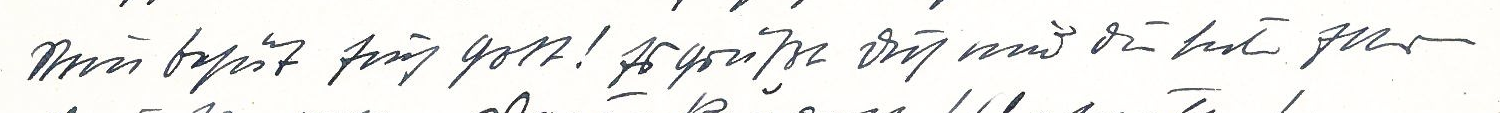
Nun behüt Euch Gott! Es grüßt Dich und die lieben Eltern
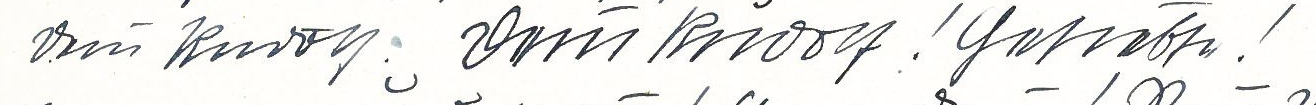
Dein . Dein ! Geliebte!
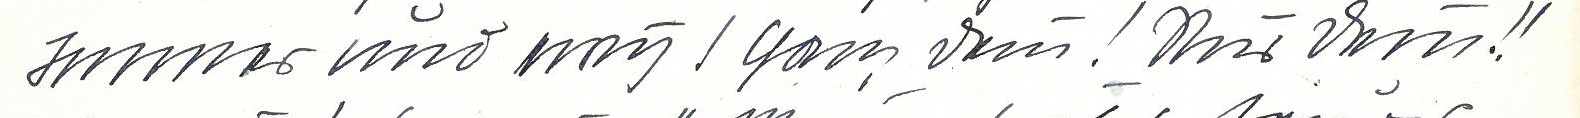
Immer und ewig! Ganz Dein! Nur Dein!
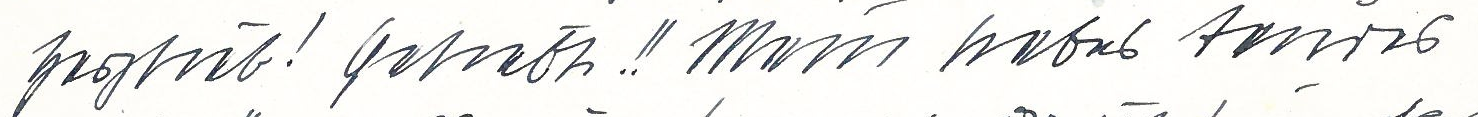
Herzlieb! Geliebte!! Mein liebes teures
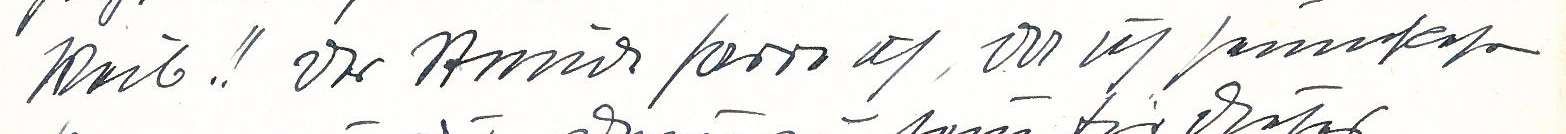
Weib!! Der Stunde harre ich, da ich heimkehren
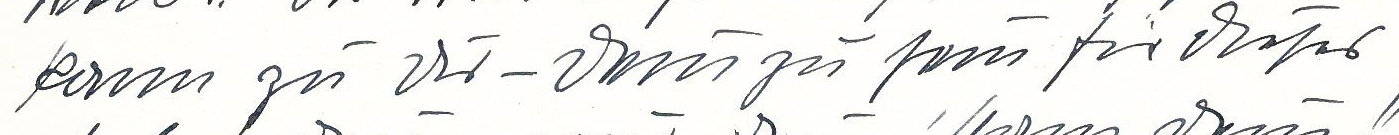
kann zu Dir – Dein zu sein für dieses
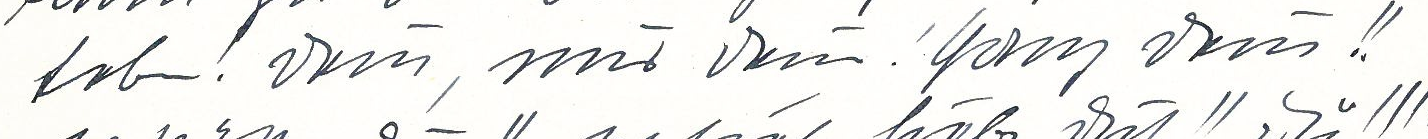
Leben! Dein, nur Dein! Ganz Dein!!
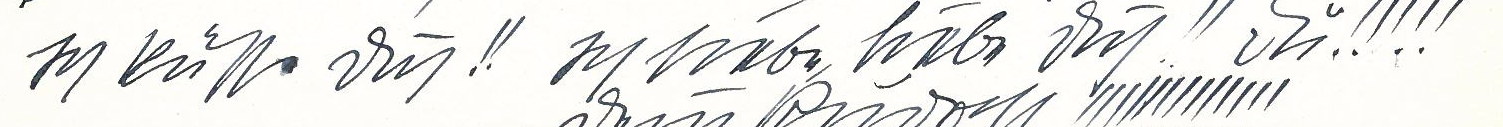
Ich küsse Dich!! Ich liebe, liebe Dich!! Du!!!!!
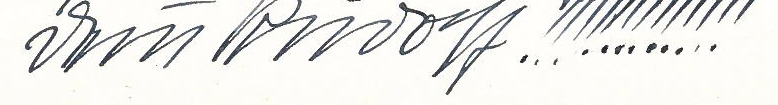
Dein !!!!!!!!!!!!
